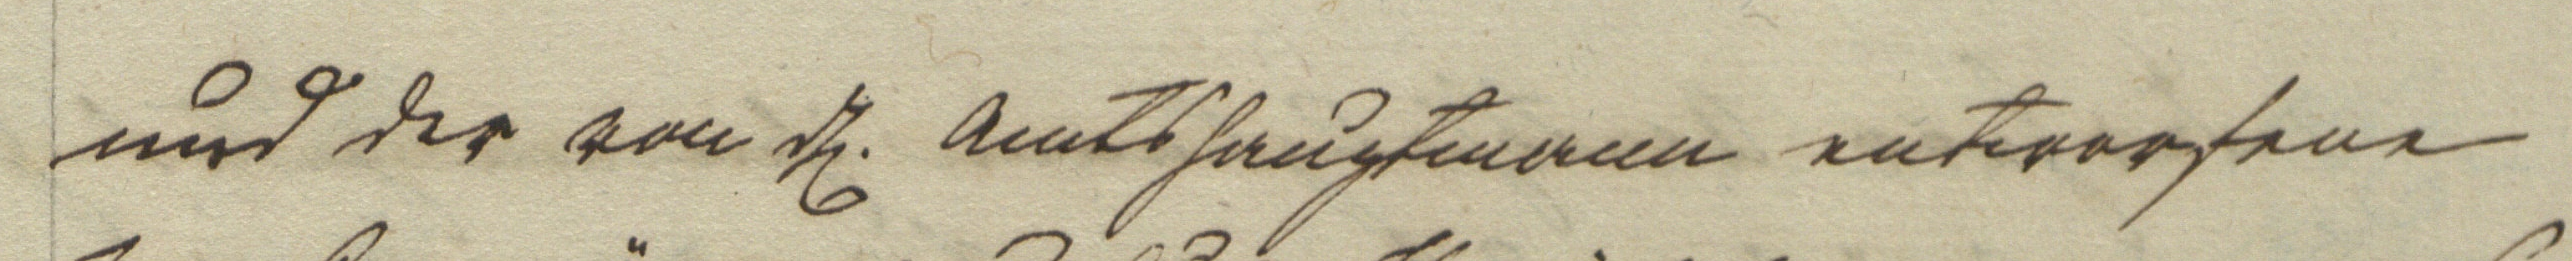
und der von dh. Amtshauptmann entworfene
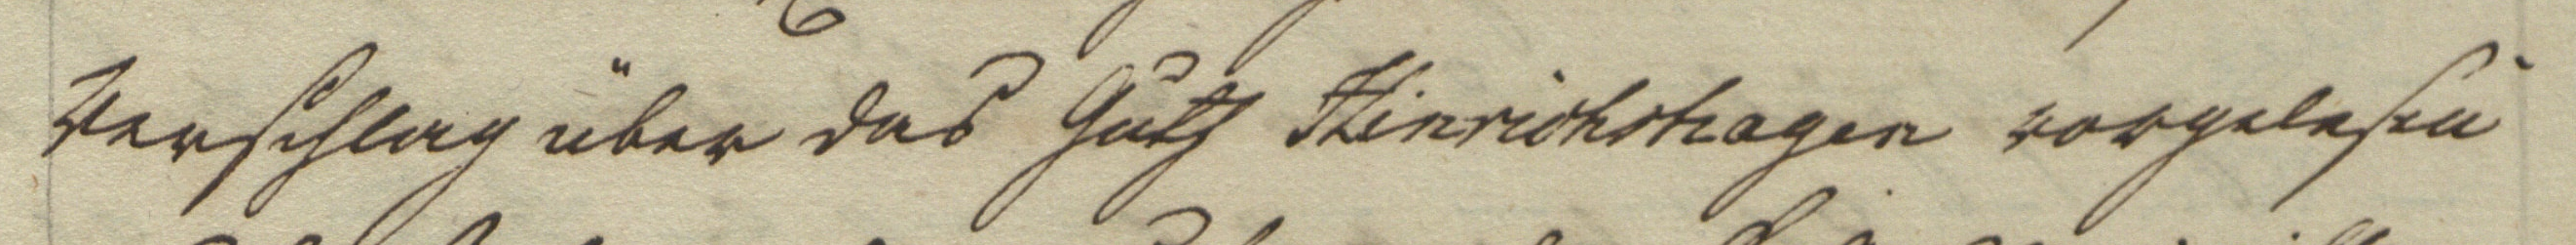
Verschlag über das Guth Hinrichshagen vorgelesn
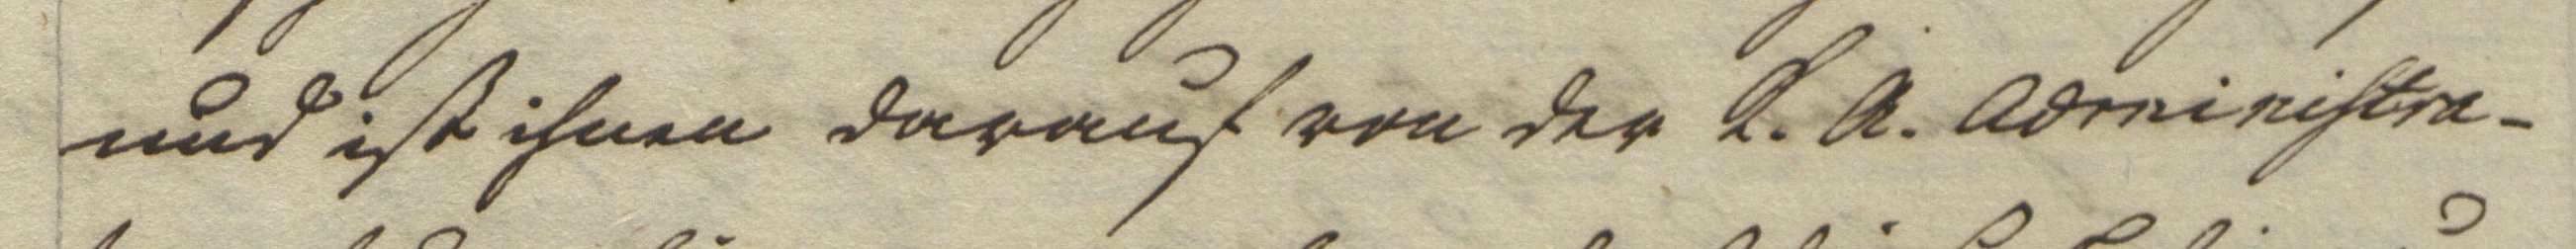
und ist ihnen darauf von der K. A. Administra¬
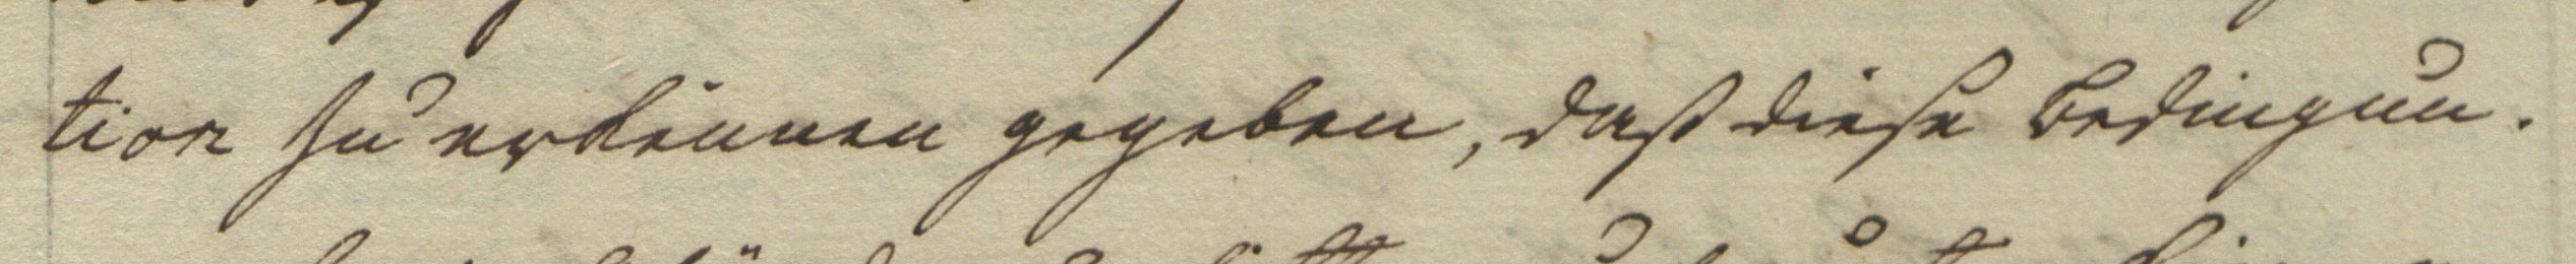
tion zu erkennen gegeben, daß diese Bedingun¬
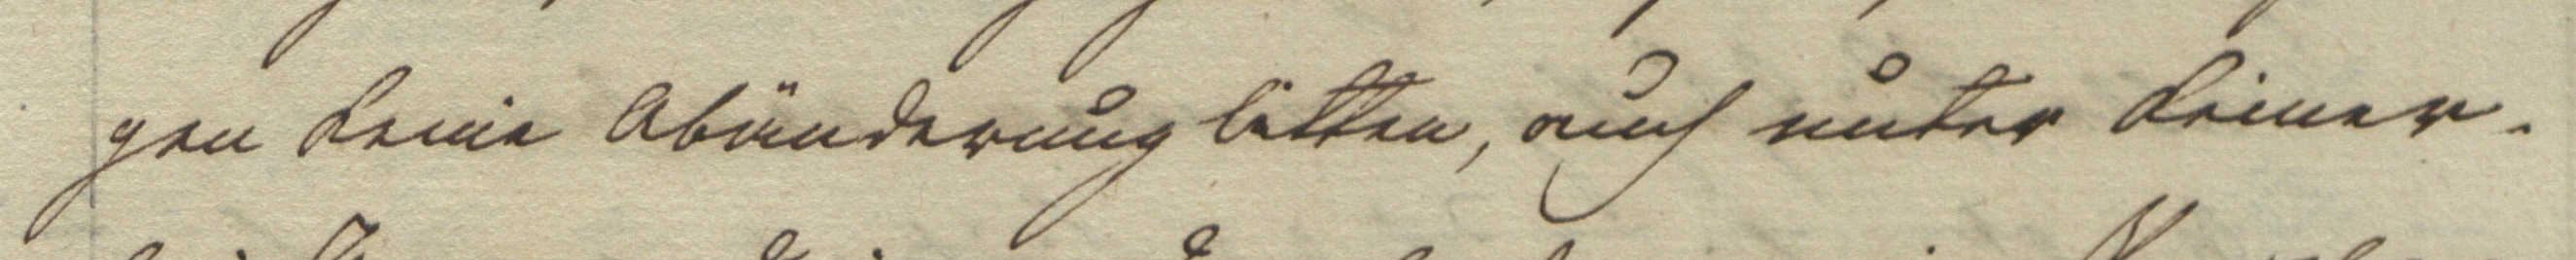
gen keine Abänderung litten, auch unter keiner¬
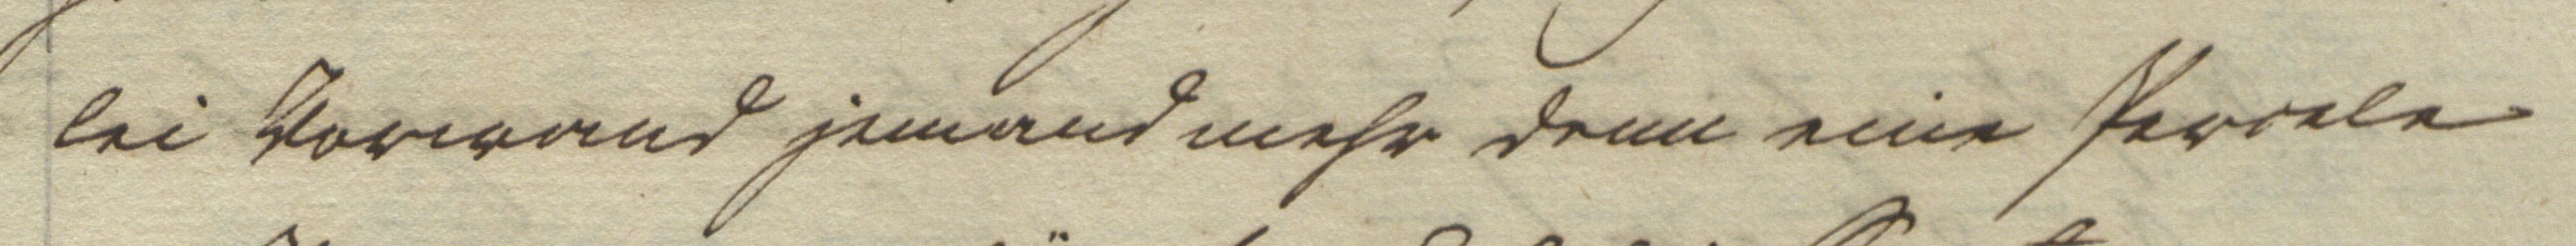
lei Vorwand jemand mehr denn eine Percele
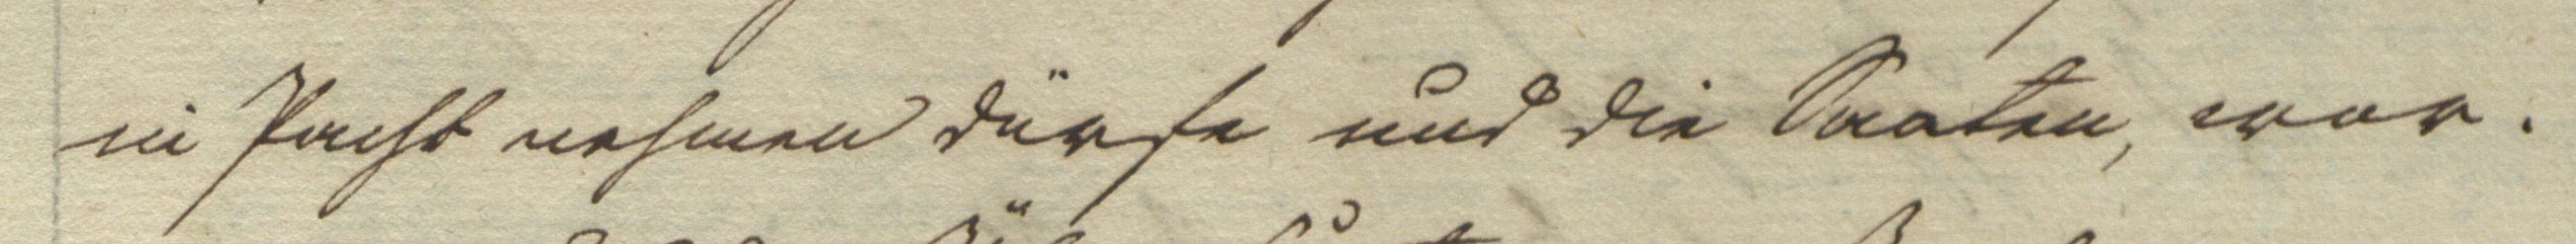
in Pacht nehmen dürfen und die Saaten, wor¬
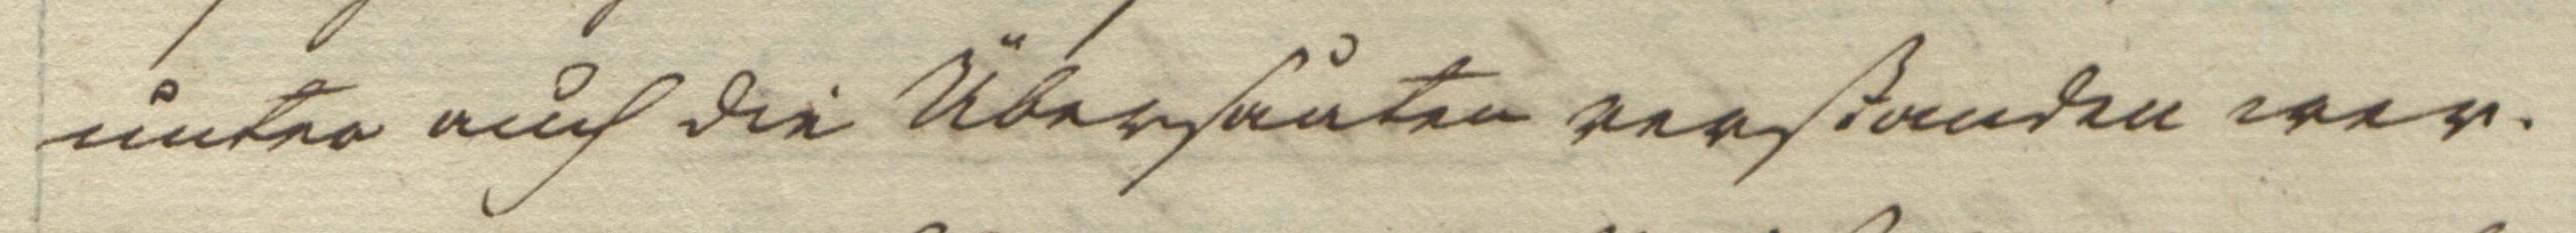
unter auch die Übersauten verstanden wer¬
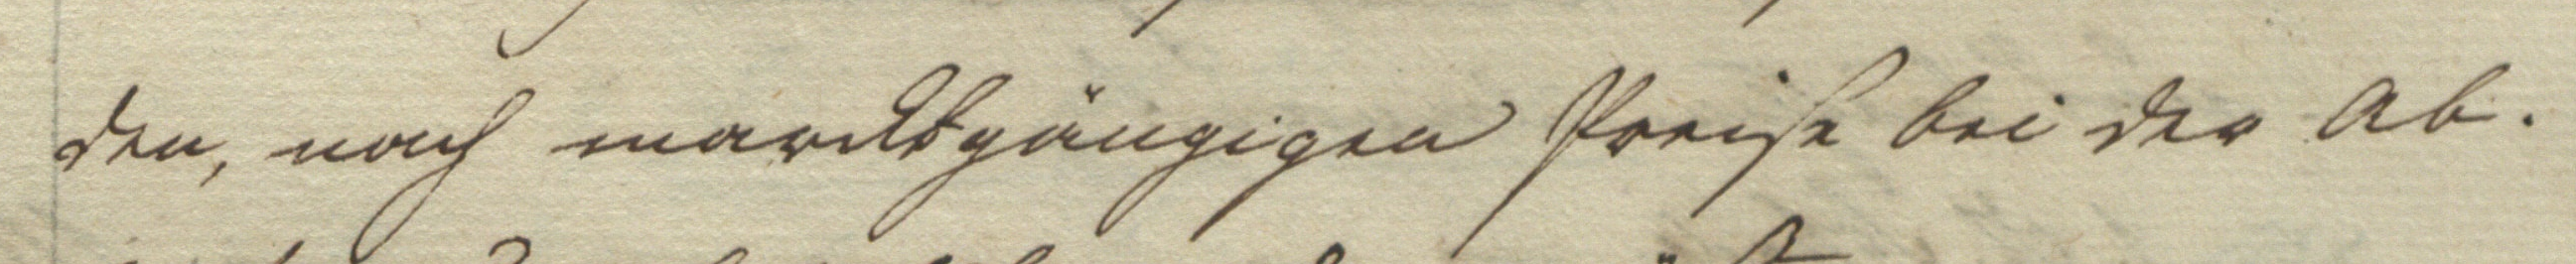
den, nach marcktgängigen Preise bei der Ab¬
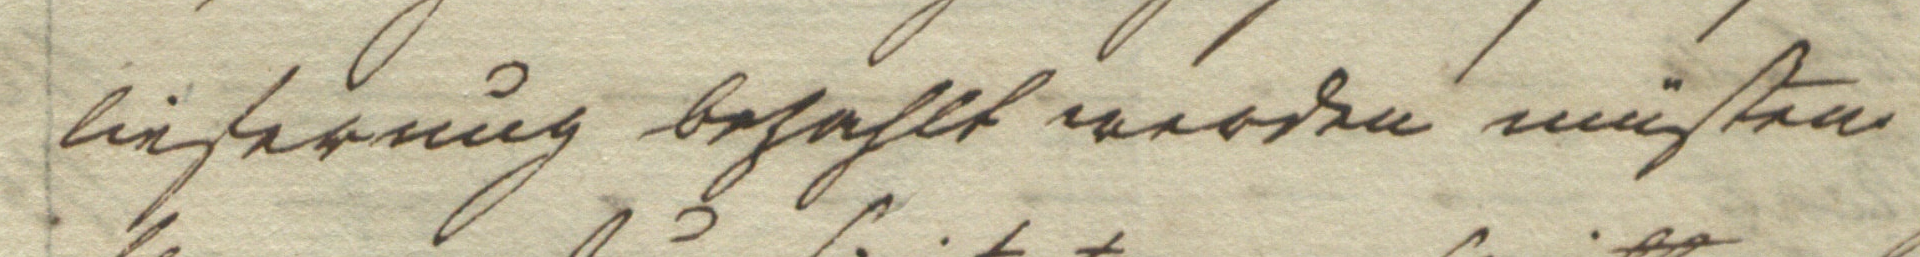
lieferung bezahlt werden müßten.
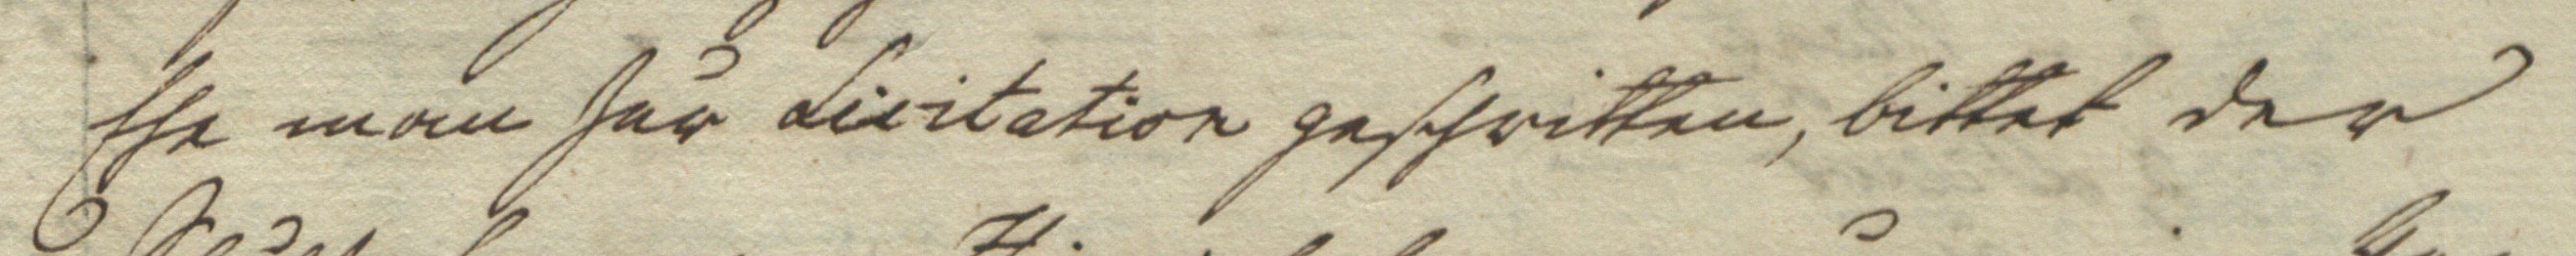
Ehe man zur Licitation geschritten, bittet der
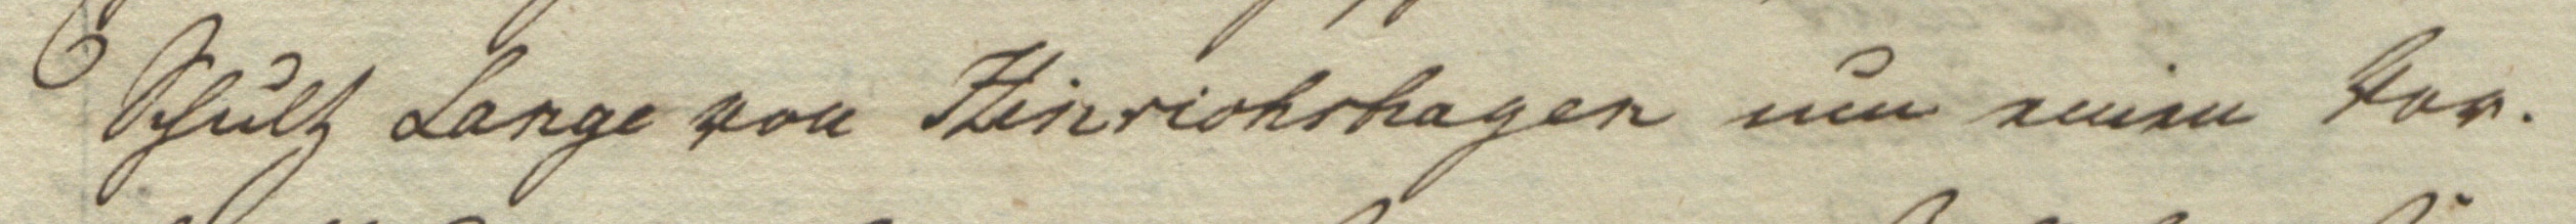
Schulz Lange von Hinrichshagen um einen Vor¬
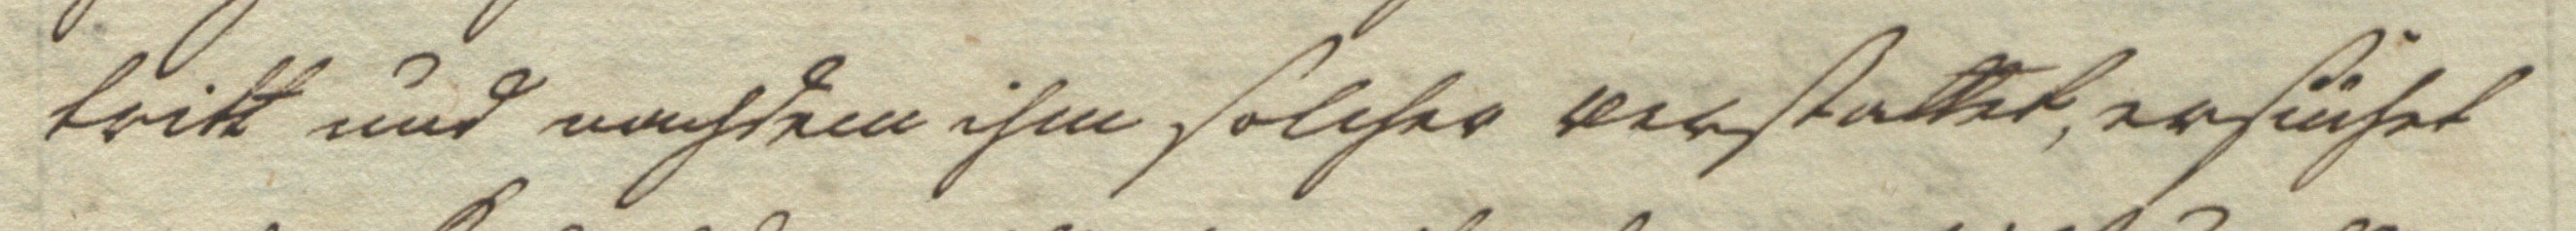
tritt und nachdem ihm solcher verstattet, ersuchet
